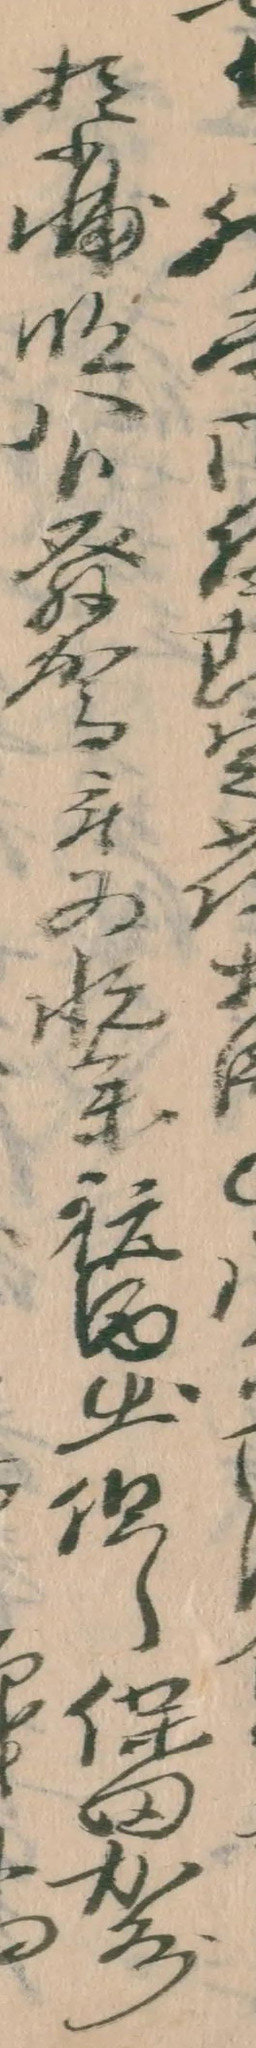権少輔明八日発駕ニ付為悦参祝酒出但し保田加
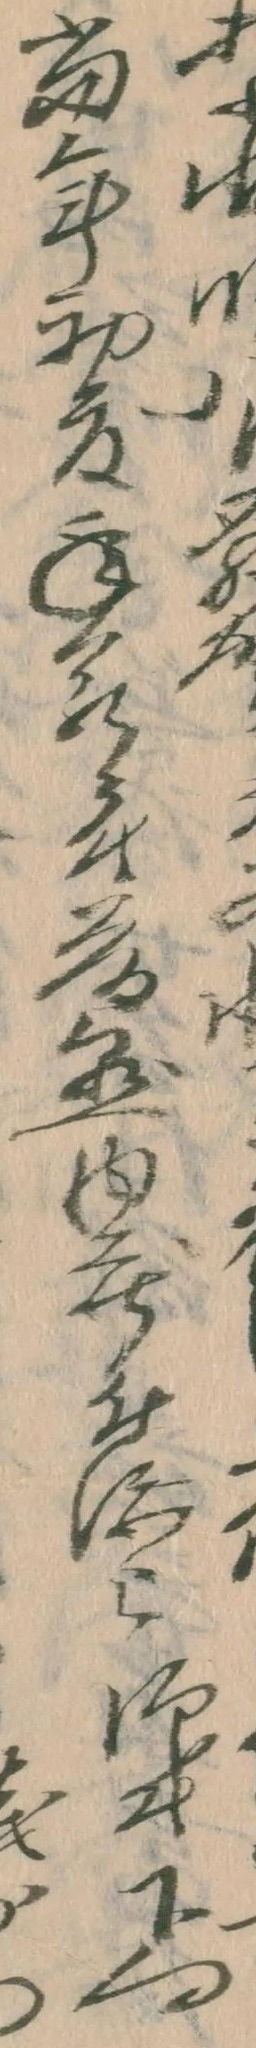當年初度年若ニ付藤懸内蔵付添被仰付下向
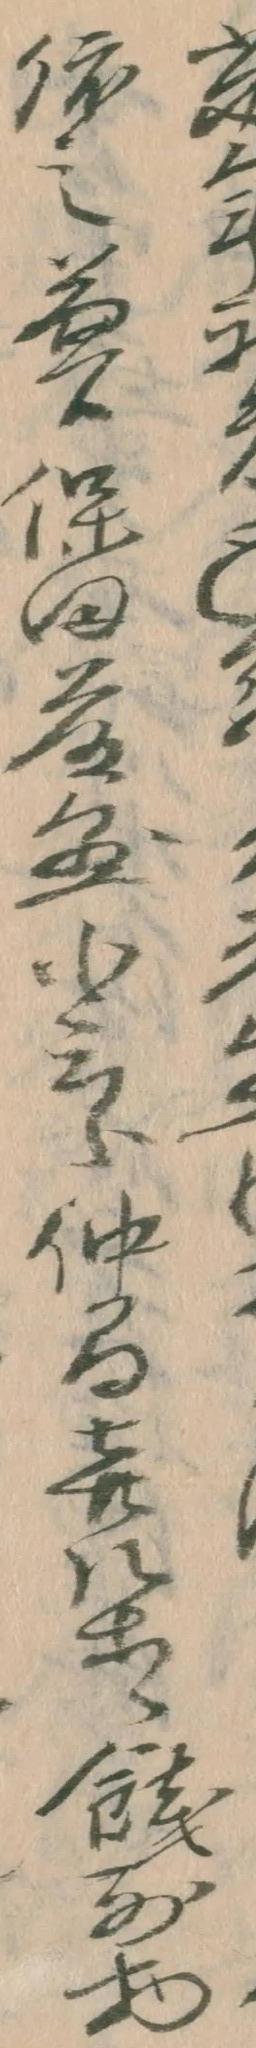依之兼而保田藤懸小三郎仲間喜八等へ餞別物
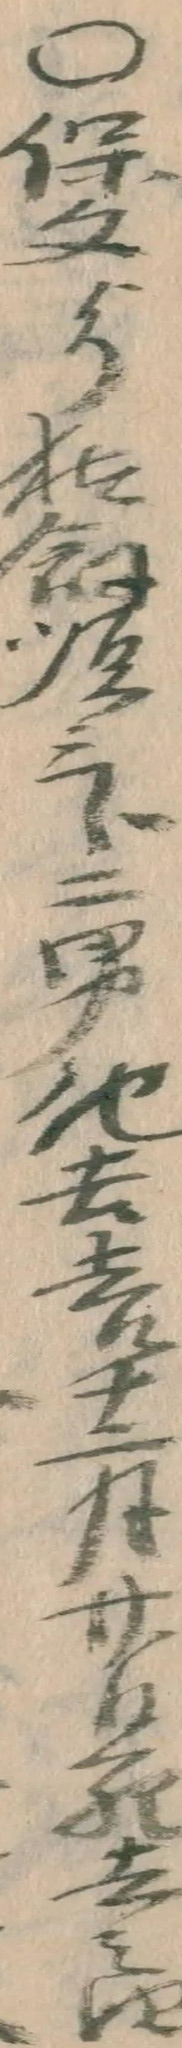〇保文より猪飼順三郎二男死去去ル十二月廿日死去之由
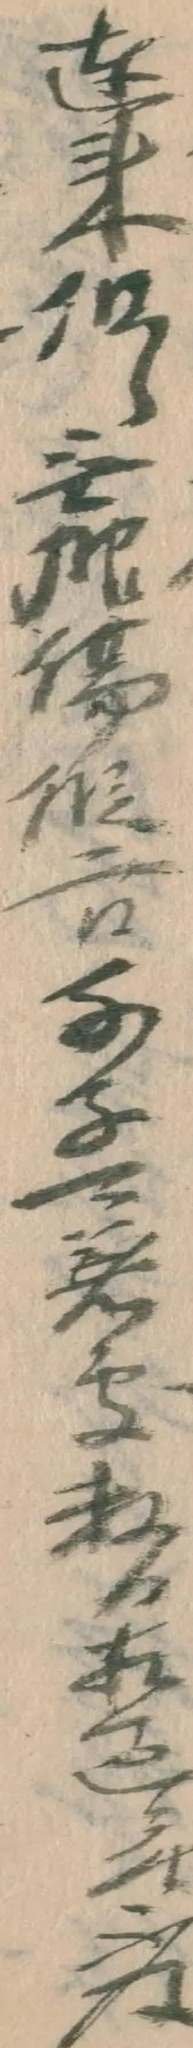達来但し無服傷假二日千子可着處数日相過ニ付不及
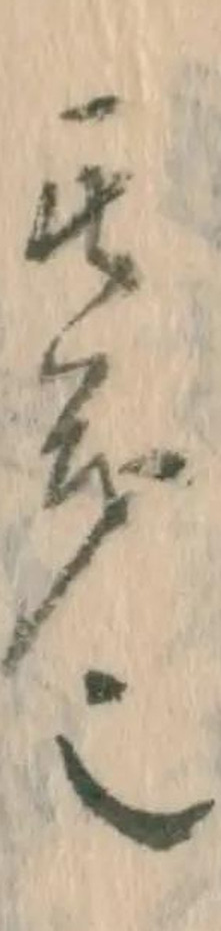其義也
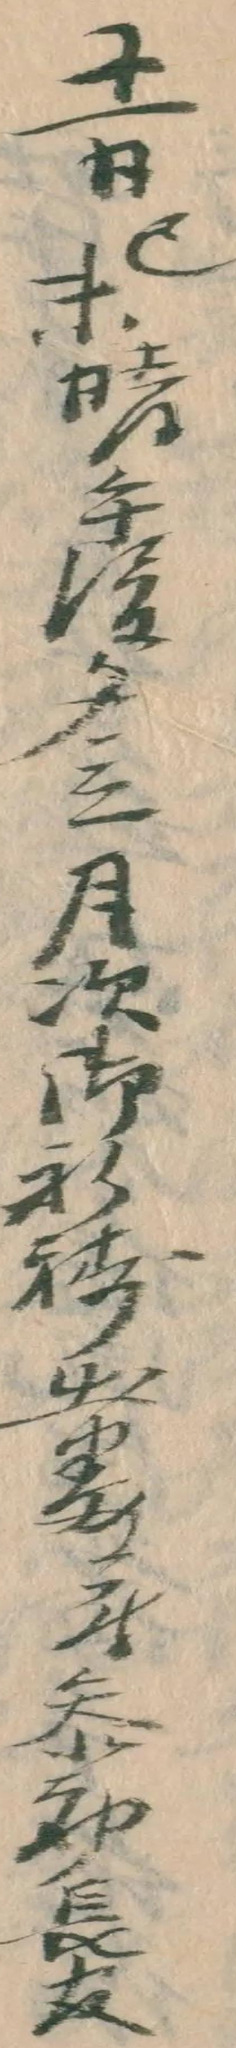十一日己未晴午後夕立月次御祈祷出番ニ付参勤長友
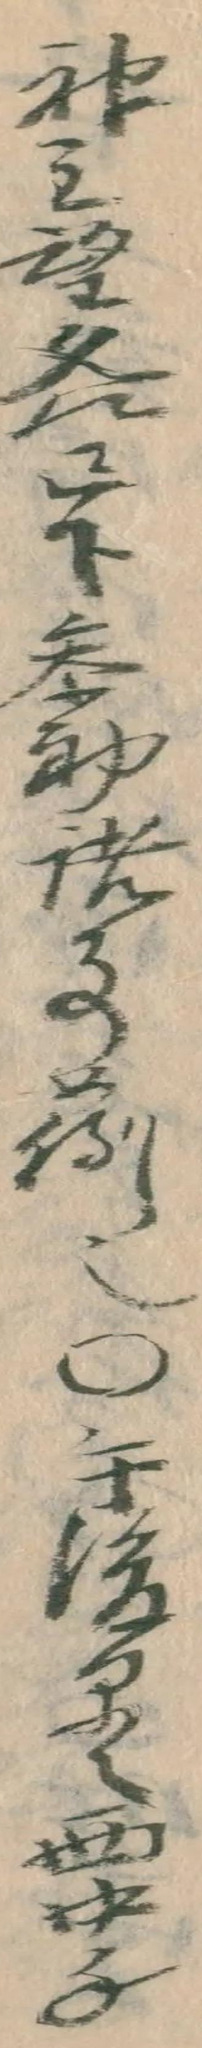神主望久卿已下参勤諸事如例也○午後早々西中手
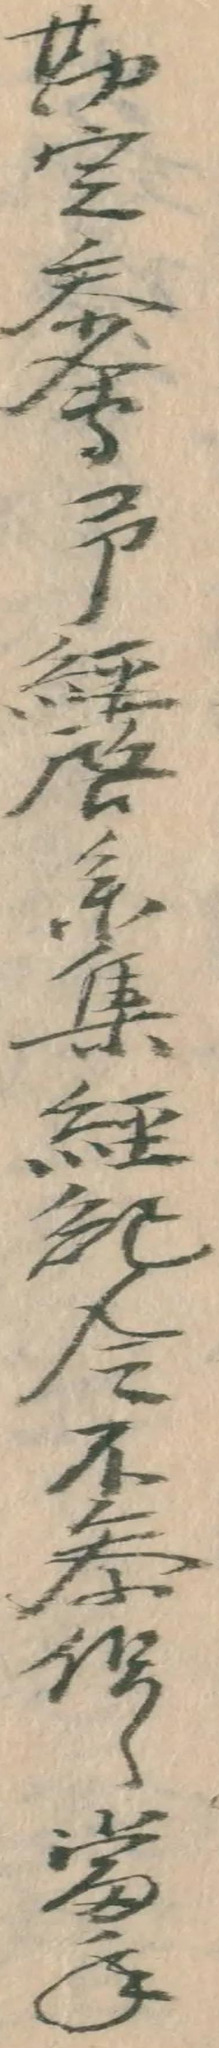勘定参會予経啓参集経紀令不参但し當年
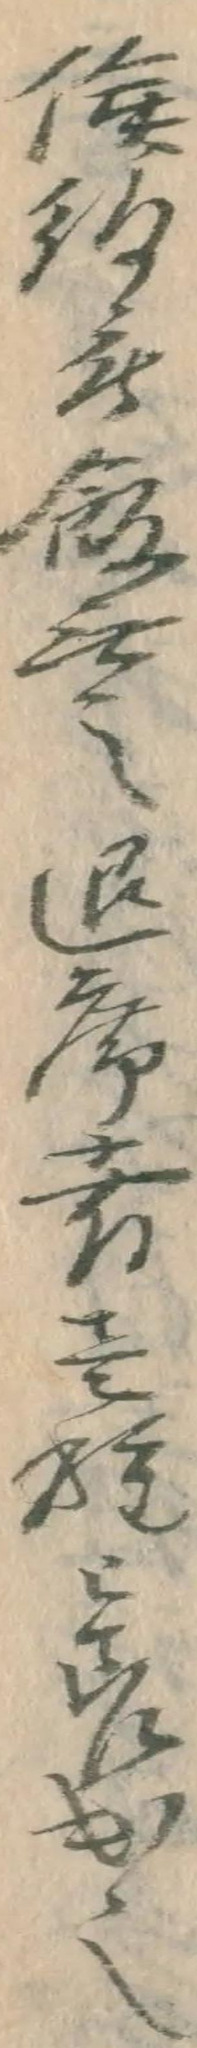倹約ニ付飯無之退席肴壱種被差出也

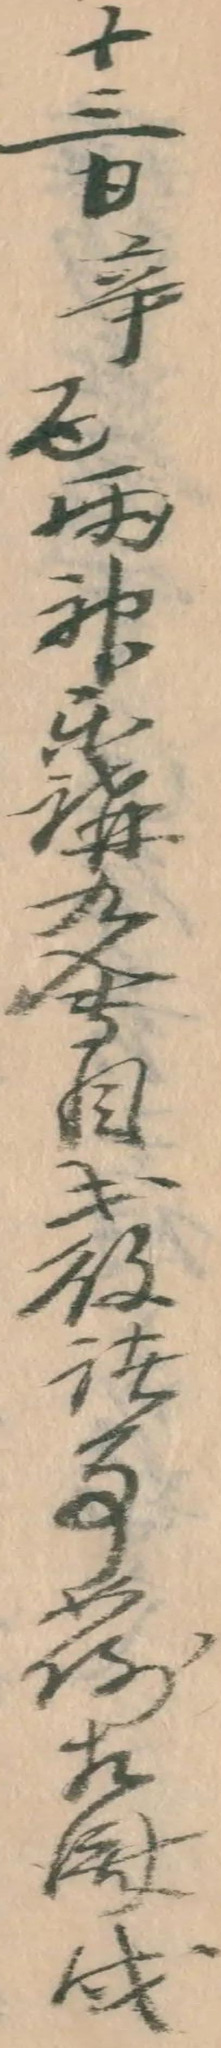十三日辛酉雨神楽講九會目出役諸事如例相済戌
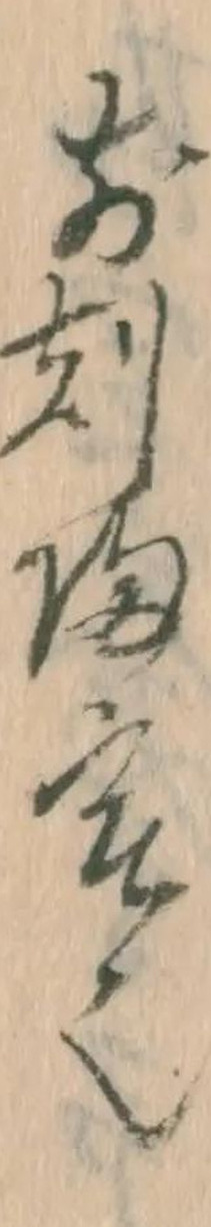前刻帰宅也
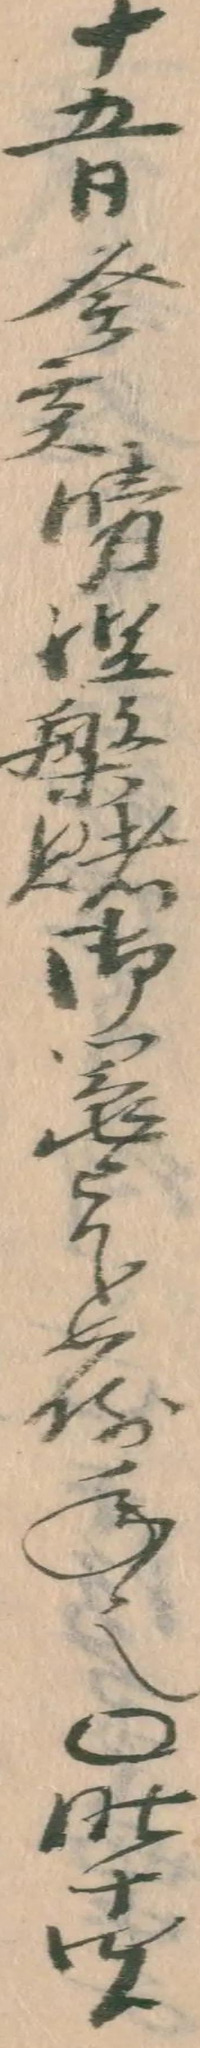十五日癸亥晴涅槃賭御鬮被下候如例年之◯昨十四日
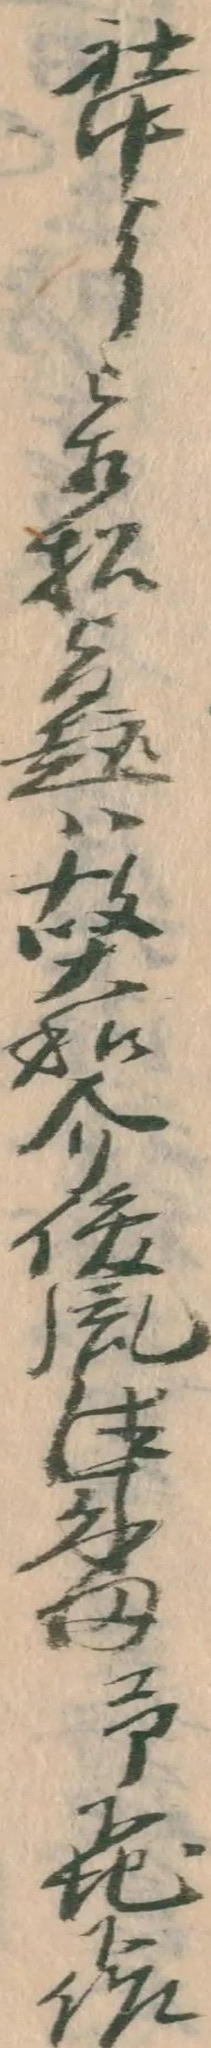社中より被相招旨趣ハ故大和介俊胤往来田予下地下作
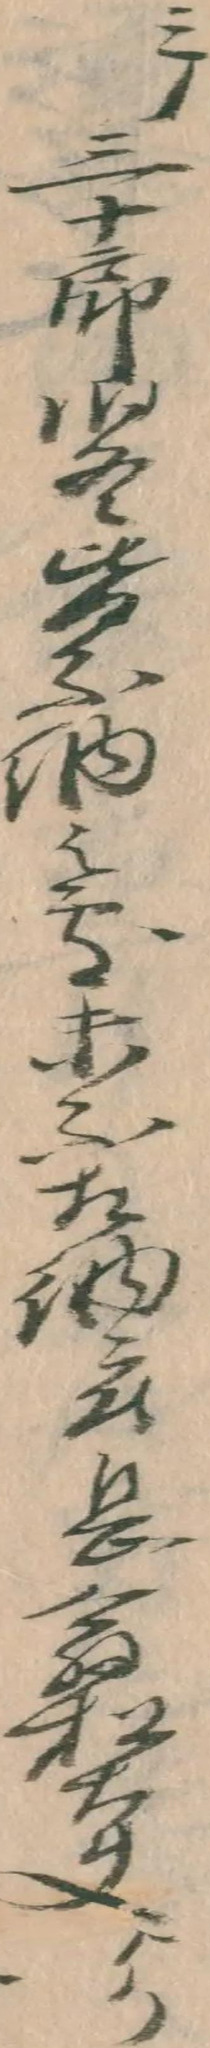にて三十郎旧冬皆不納之處未不相納ニ付息翁松大夫より
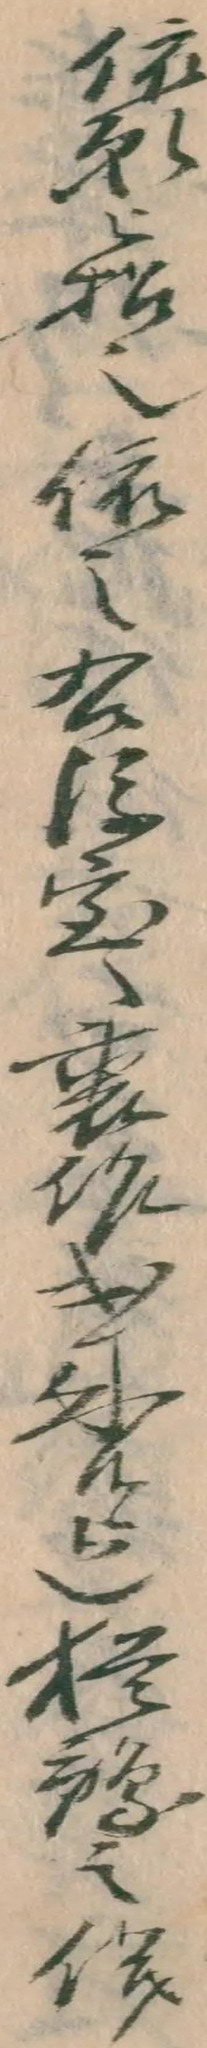依願被様也依之右後室へ裏作出来候迄猶豫之儀
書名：賀茂社記録. 第67冊
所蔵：国立国会図書館 National Diet Library, JAPAN
